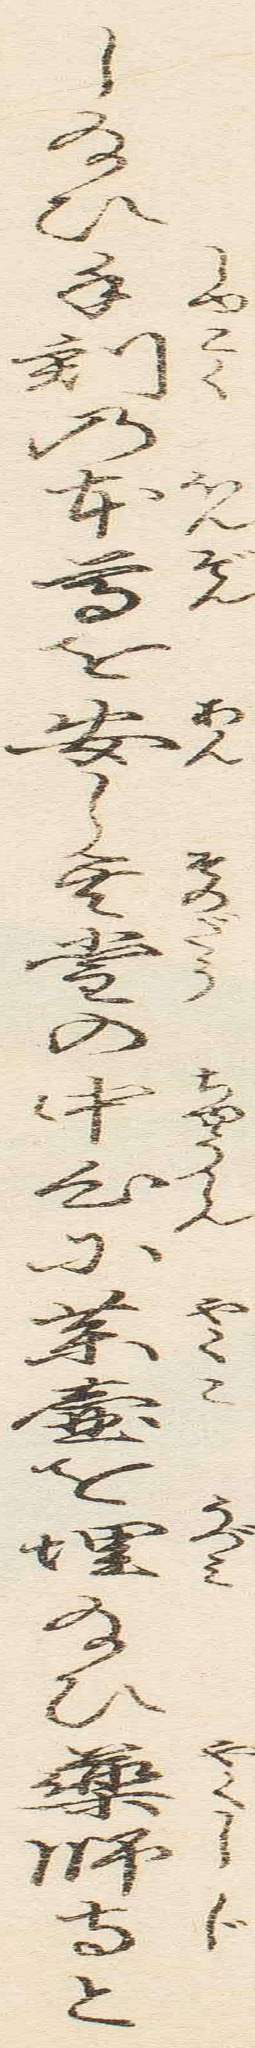し給ひ手𠜇の本尊を安し其堂の中心に薬壷を埋給ひ薬師寺と
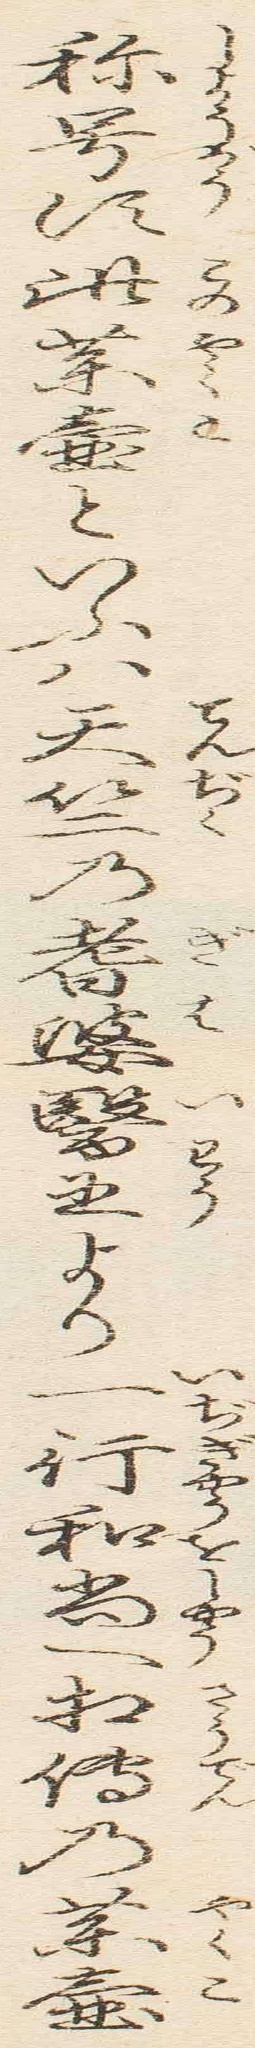称号す此薬壷といふは天竺の耆婆醫王より一行和尚へ相傳の薬壷
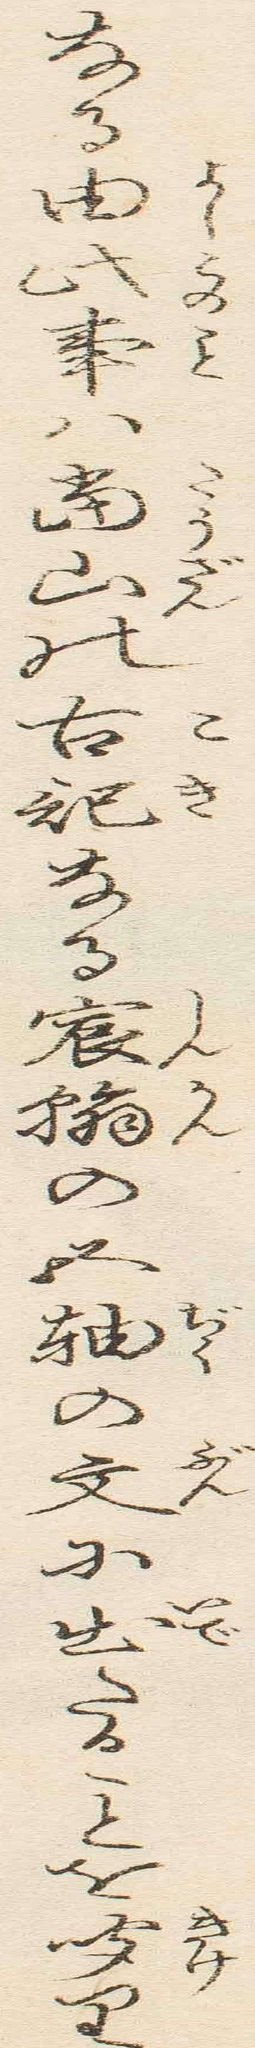なる由此事は當山の古記なる宸翰の五軸の文に出たることを聞り
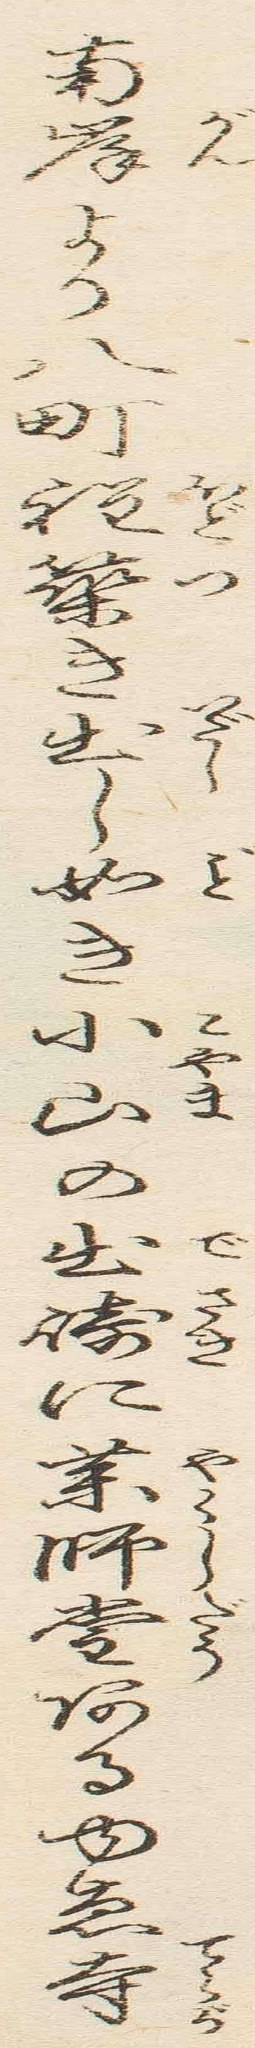南岸より八町程築き出し如き小山の出﨑に薬師堂あるゆゑ寺
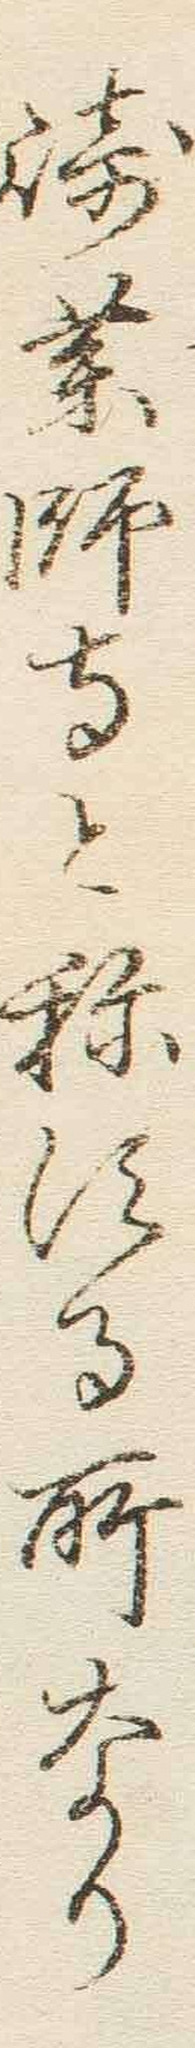﨑薬師寺と称する所なり
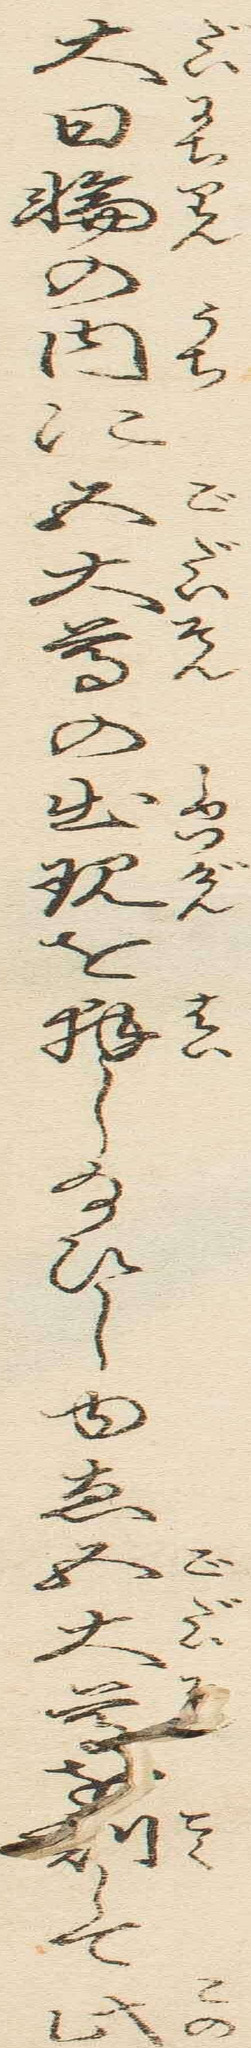大日輪の内に五大尊の出現を拝し給ひしゆゑ五大尊を𠜇して此

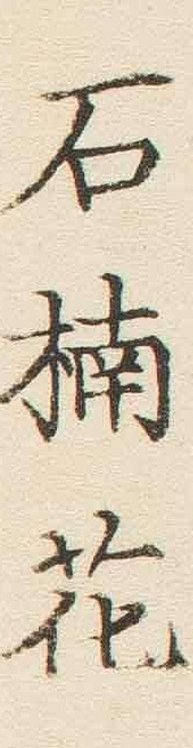石楠花

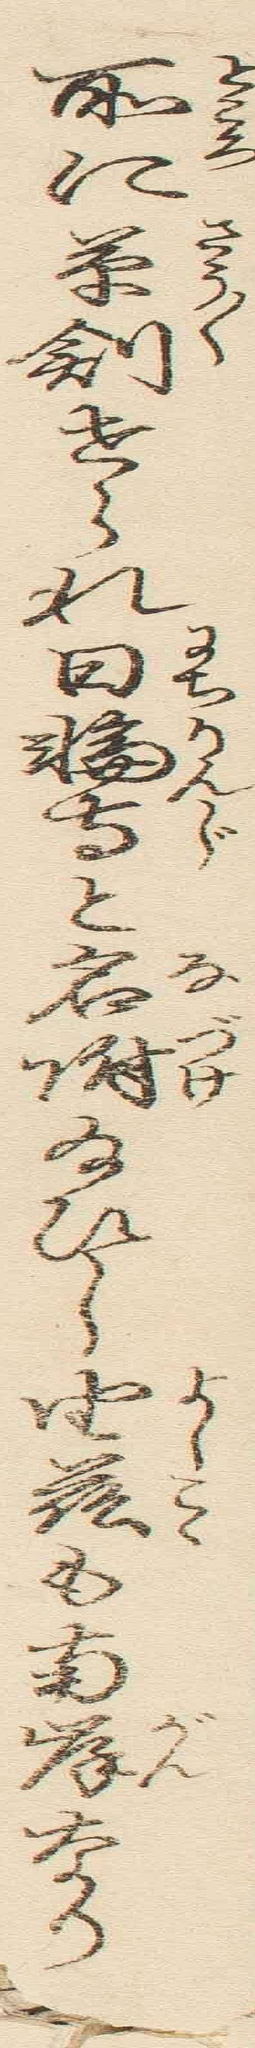所に草創せられ日輪寺と名附給ひし由兹も南岸なり
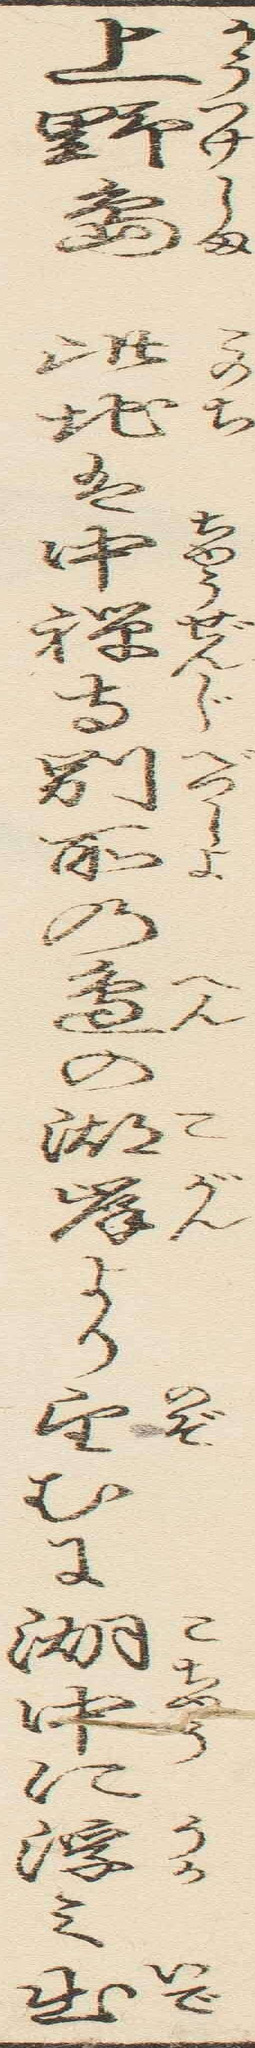上野島此地は中禅寺別所の邊の湖岸より望むに湖中に浮み出
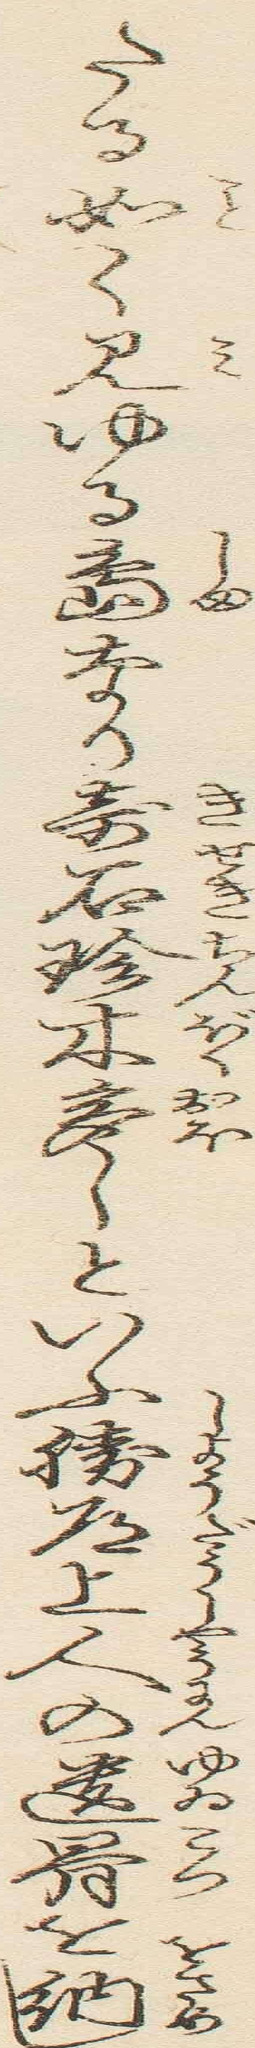たる如く見ゆる島なり竒石珍木多しといふ勝道上人の遺骨を納し
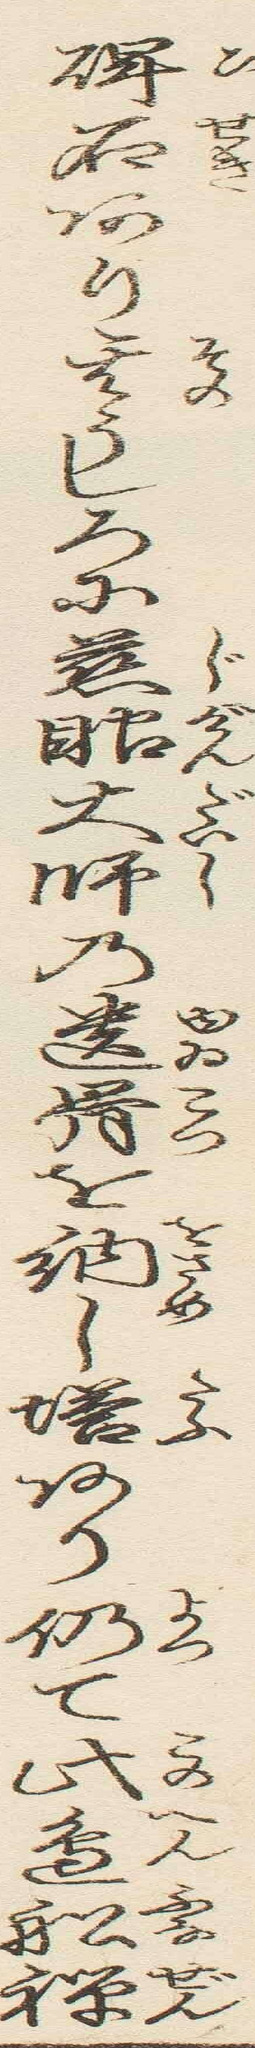碑石あり其うしろに慈眼大師の遺骨を納し塔あり仍て此邊舩禅
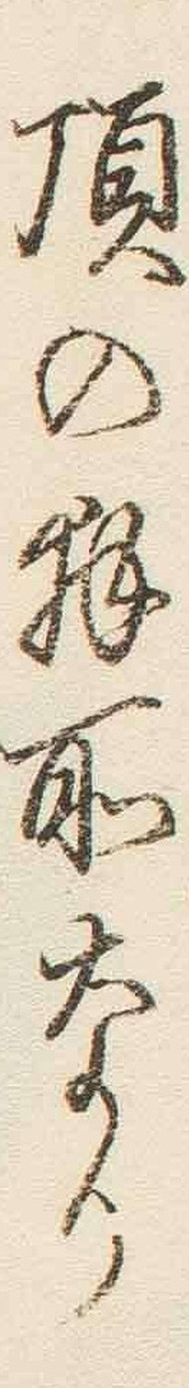頂の拝所なり
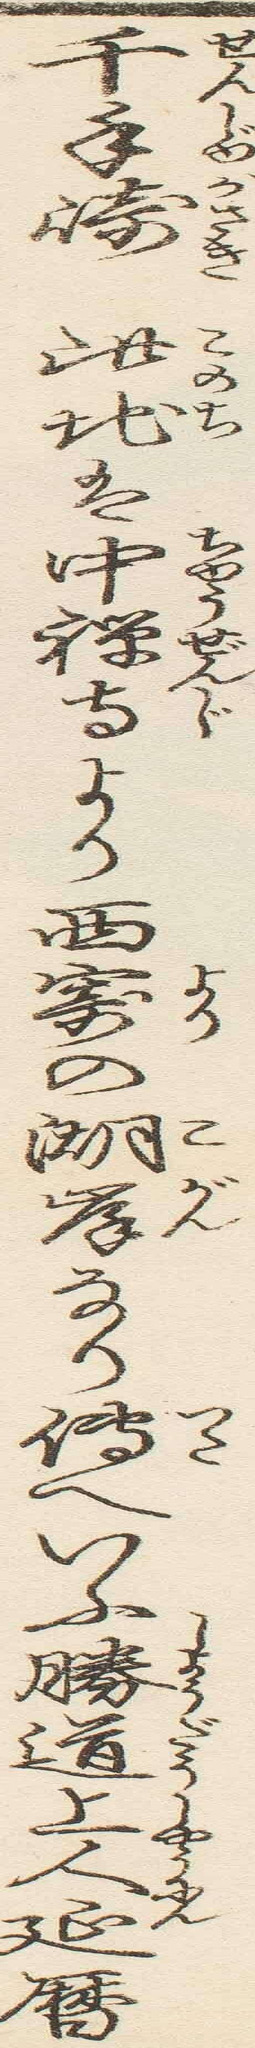千手﨑此地は中禅寺より西寄の湖岸なり傳へいふ勝道上人延暦
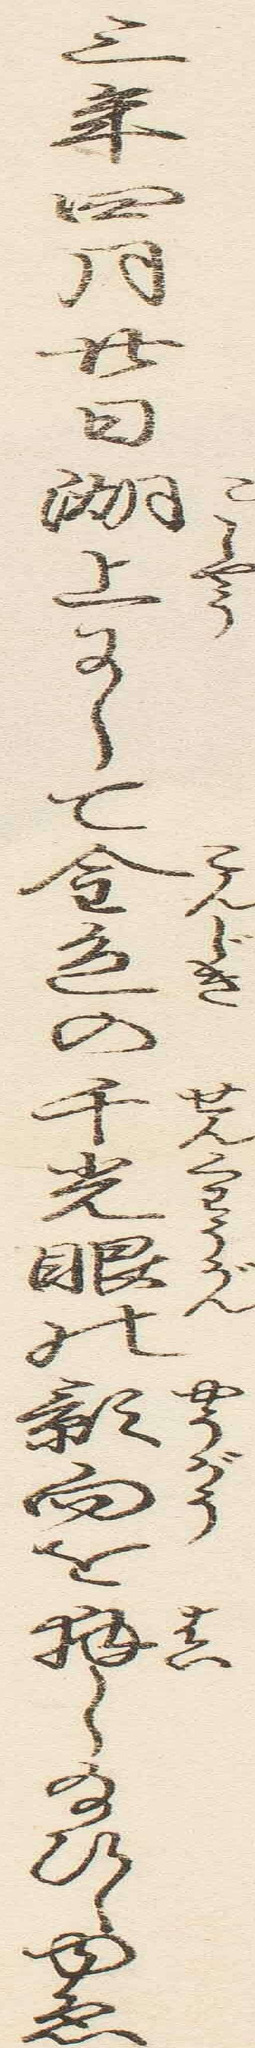三年四月廿日湖上にして金色の千光眼の影向を拝し給ひしゆゑ
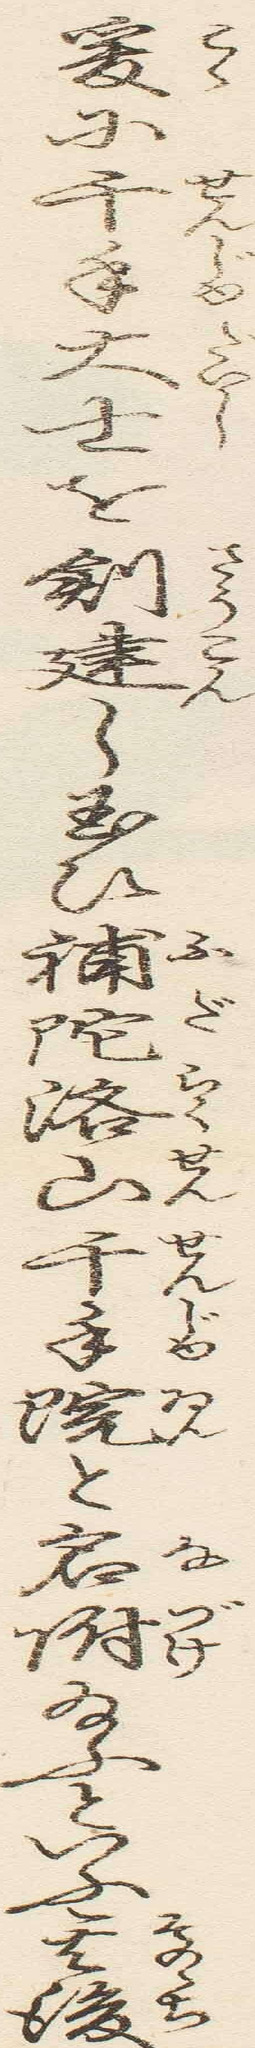爰に千手大士を創建し玉ひ補陀洛山千手院と名附給ふといふ其後
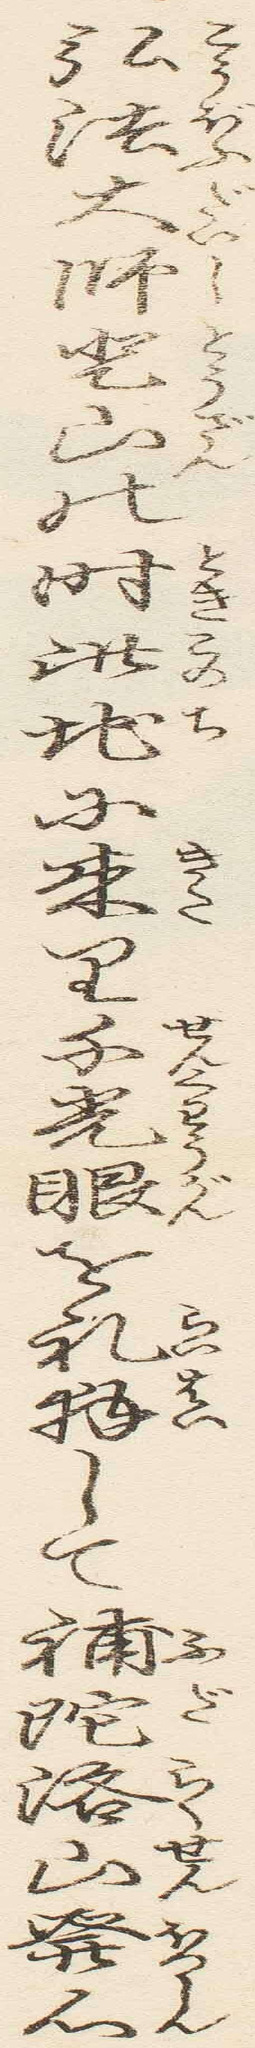弘法大師登山の时此地に來り千光眼を礼拝して補陀洛山発心
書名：日光山志
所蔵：東京学芸大学附属図書館 国文学研究資料館
